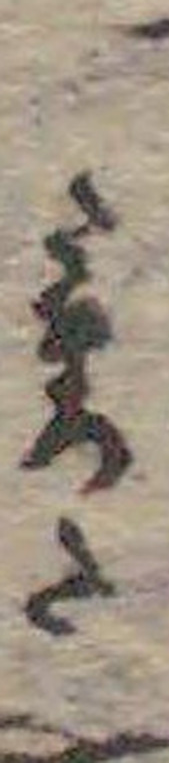こまつた
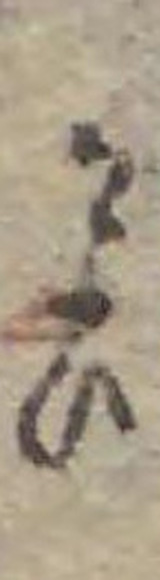かよひ
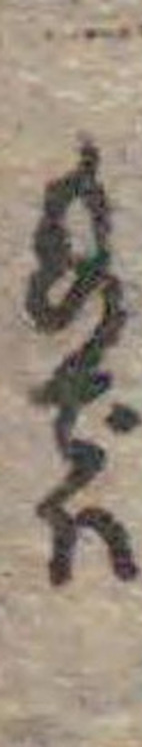ものでは

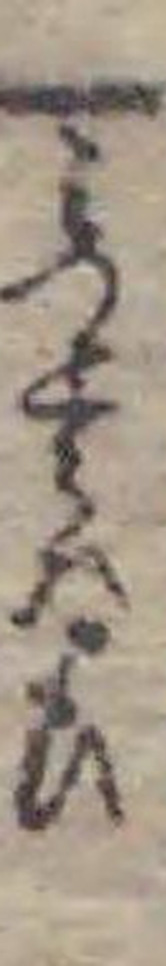みつとうはよひ
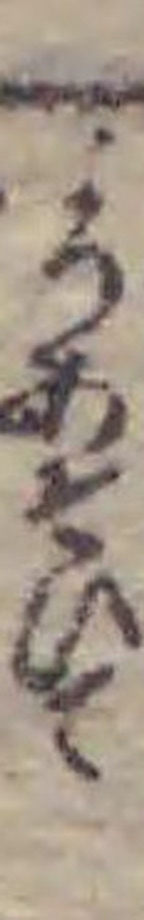よつあそひて
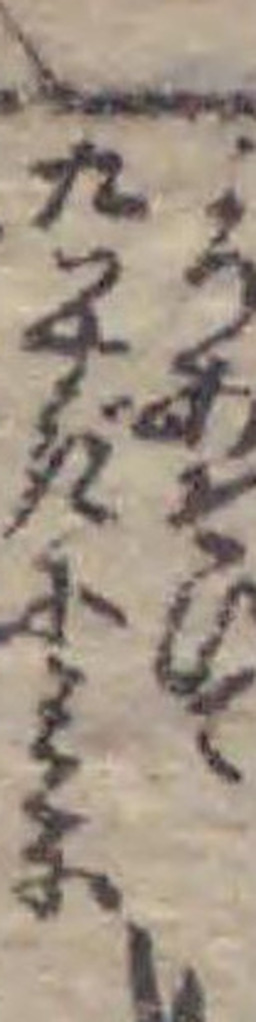九つすぎにとこに
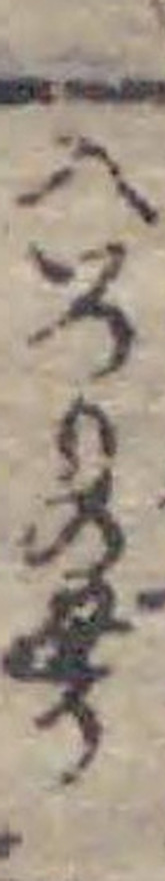入いつもの通り
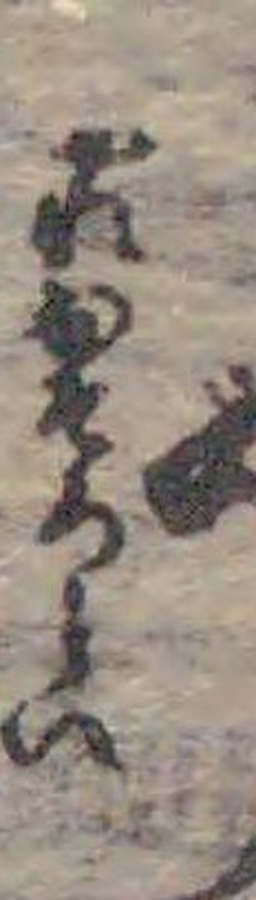やれおそろしい
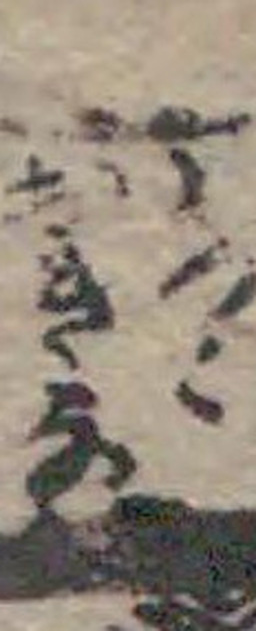おきな
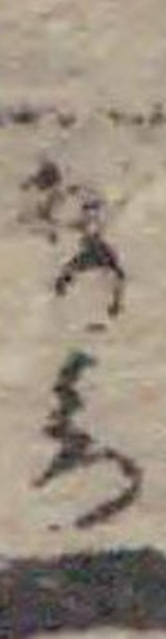おりみつ
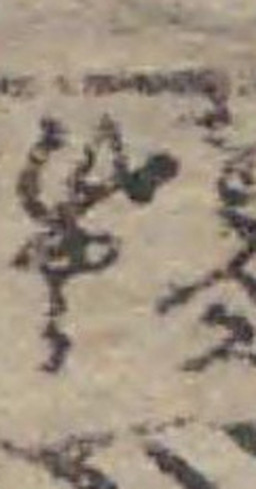ひやう
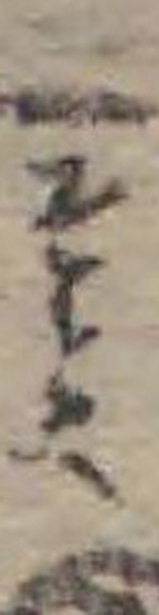そとへ
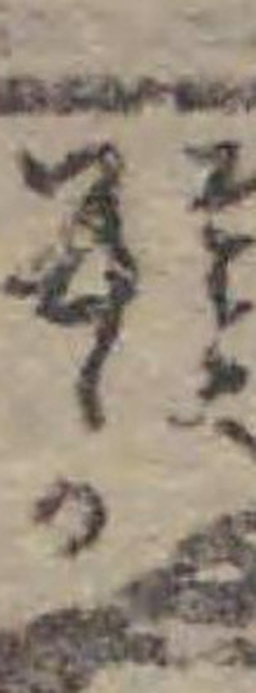いでしか
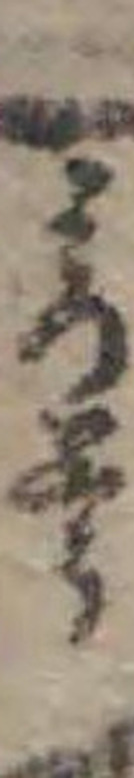みつとう
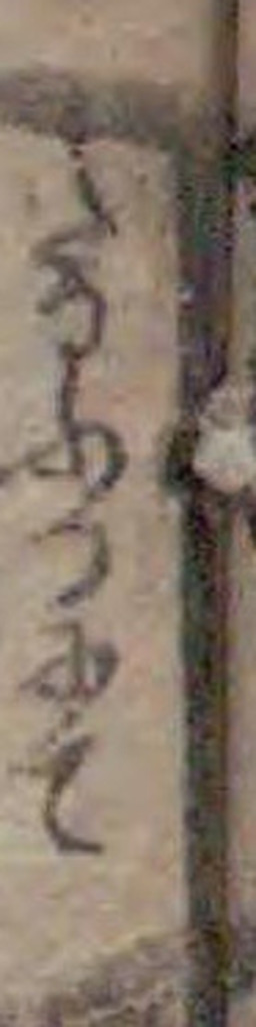たるふりにて
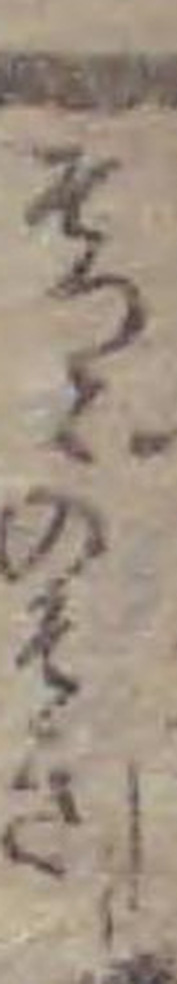そつとのそき
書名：[化物一代記] : 5巻
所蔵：国立国会図書館 National Diet Library, JAPAN
